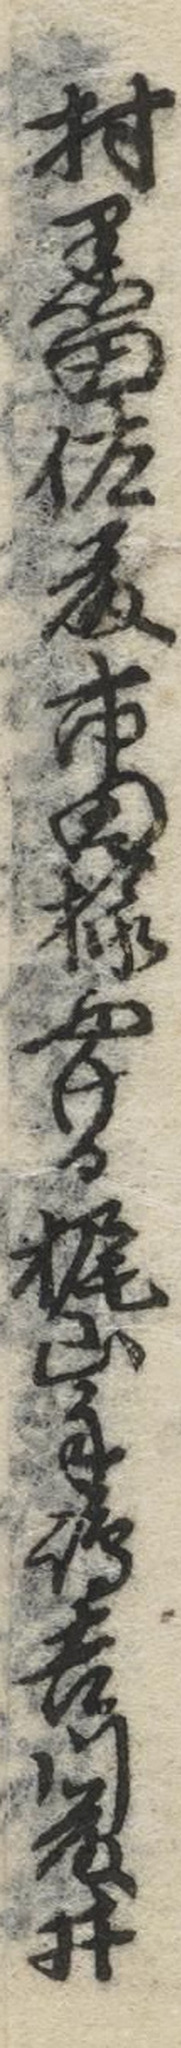村黒田佐藤市田様やける梶山手嶋吉川藤井
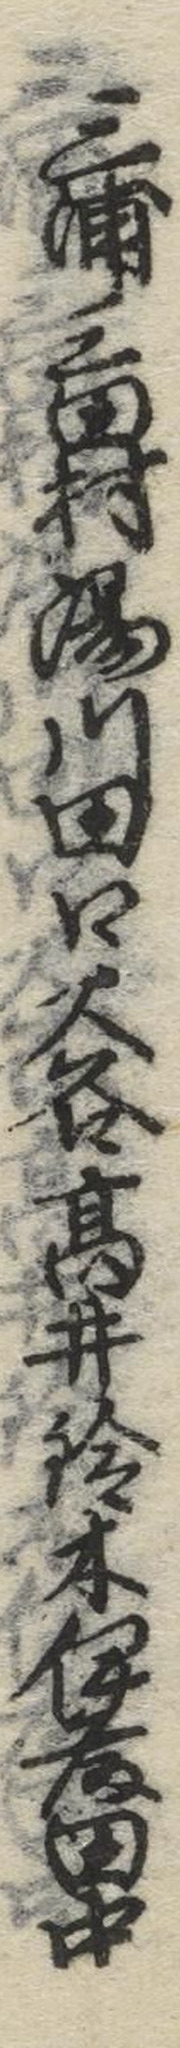三浦三田村湯川田口大谷高井鈴木伊藤田中
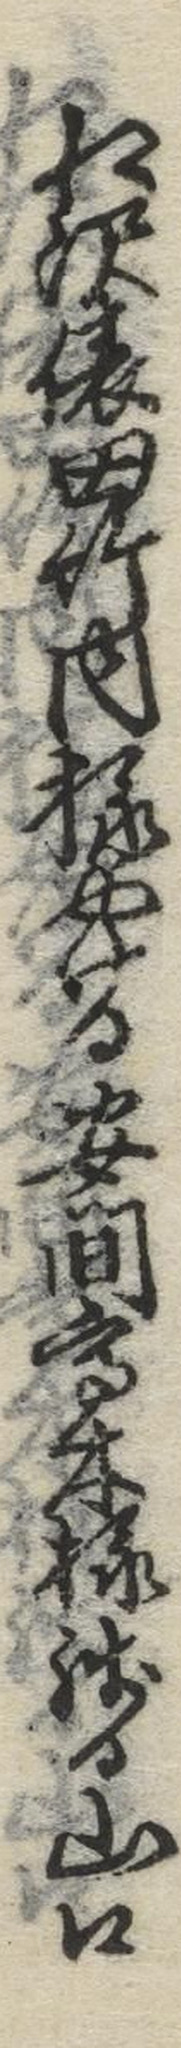江沢俵田竹内様やける安間高木様残る山口
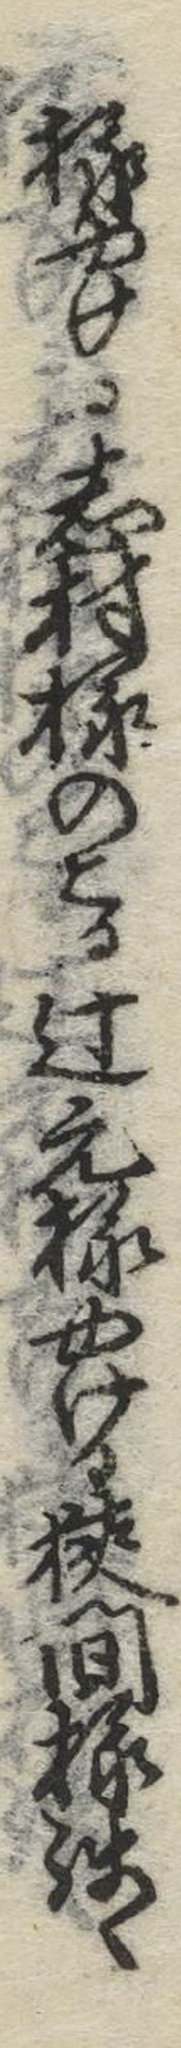様やける志村様のこる辻本様やける狭間様残
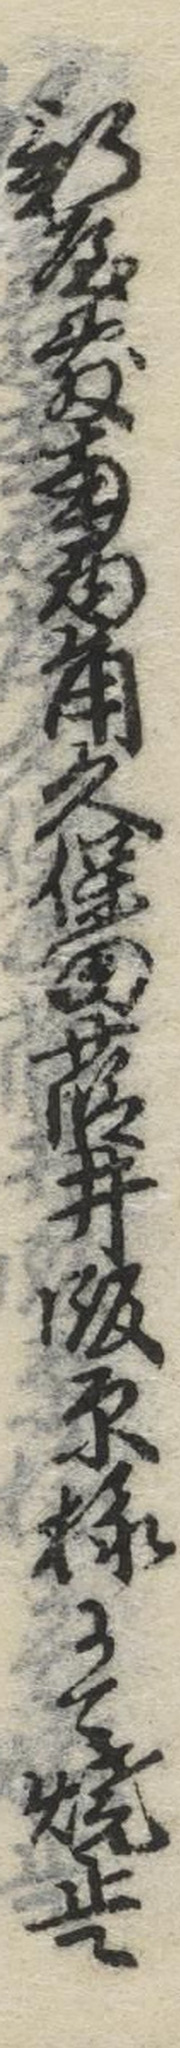新屋敷南西角久保田藤井飯原様にて焼止ル
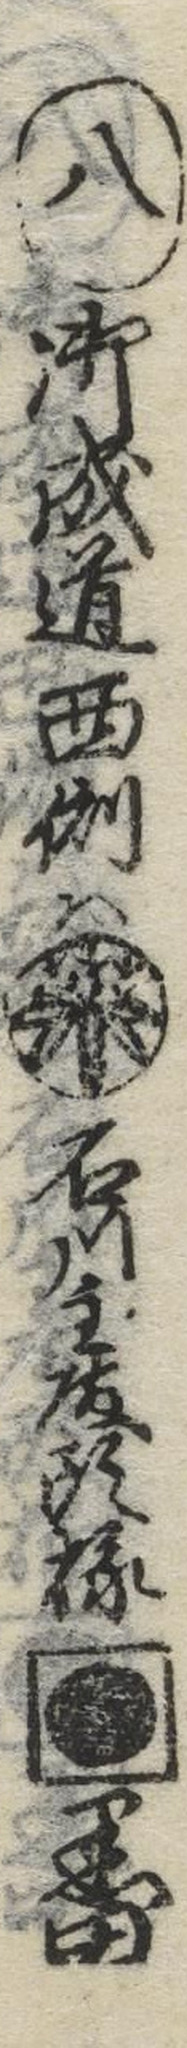八御成道西側ハ石川主殿頭様黒田
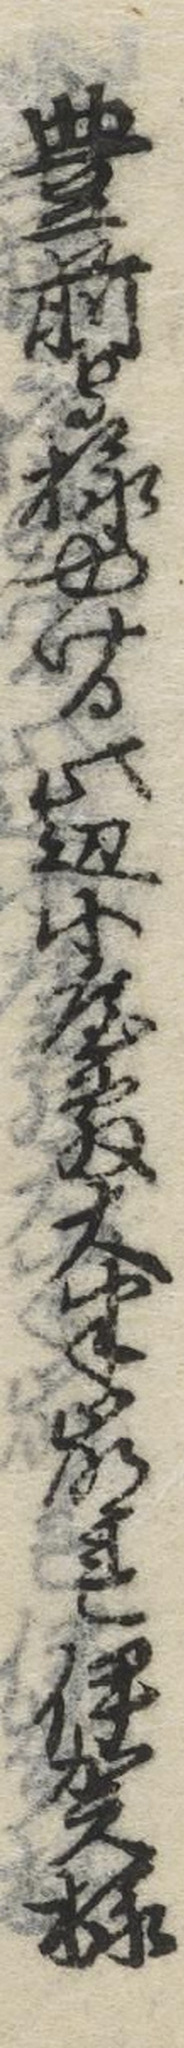豊前守様やける此辺小屋敷大半崩れ伊賀様
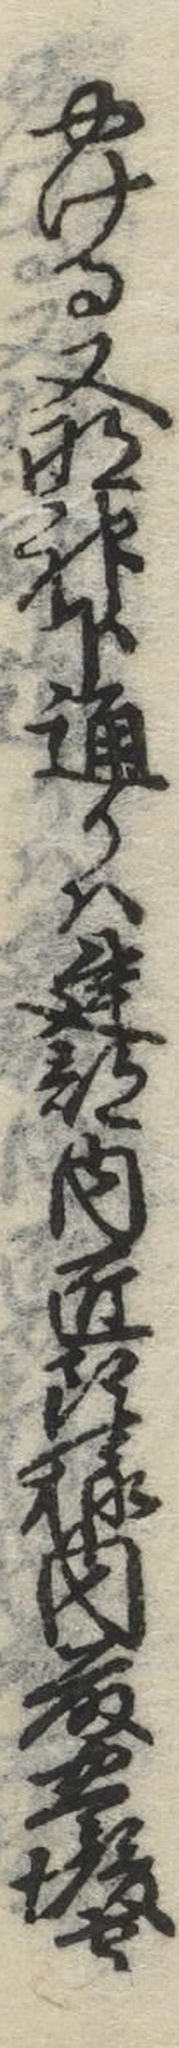やける又明神下通りハ建部内匠頭様内藤豊後守
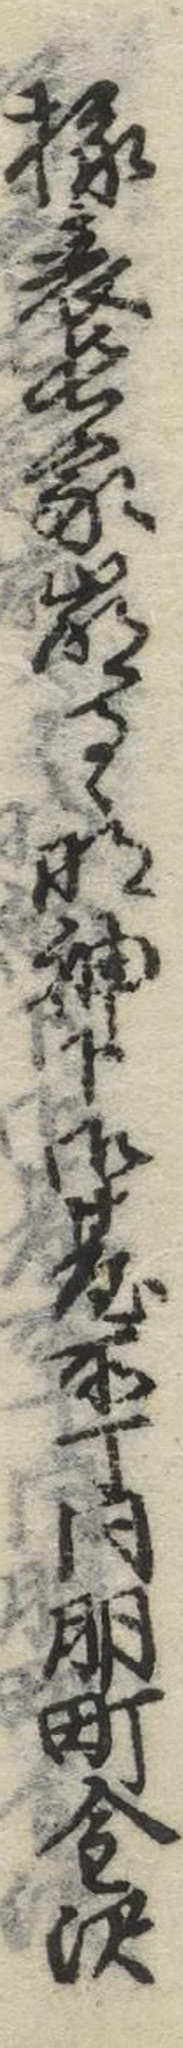様表長屋崩るゝ明神下御台所丁同朋町金沢
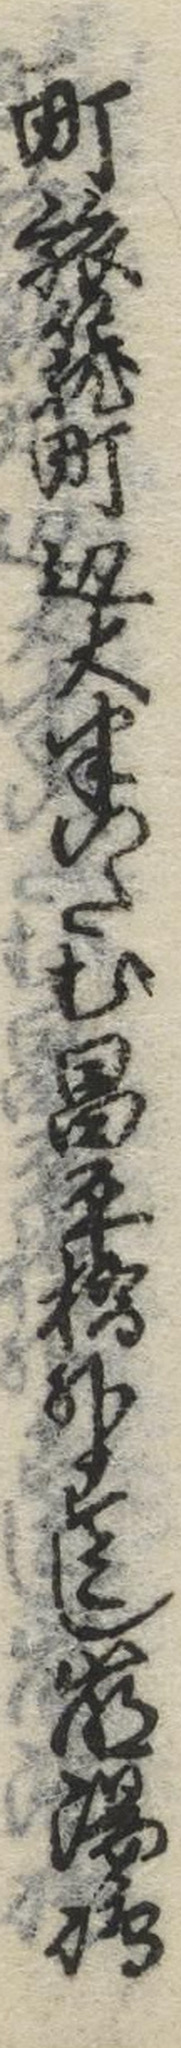町旅籠町辺大半いたむ昌平橋外すこし崩湯嶋
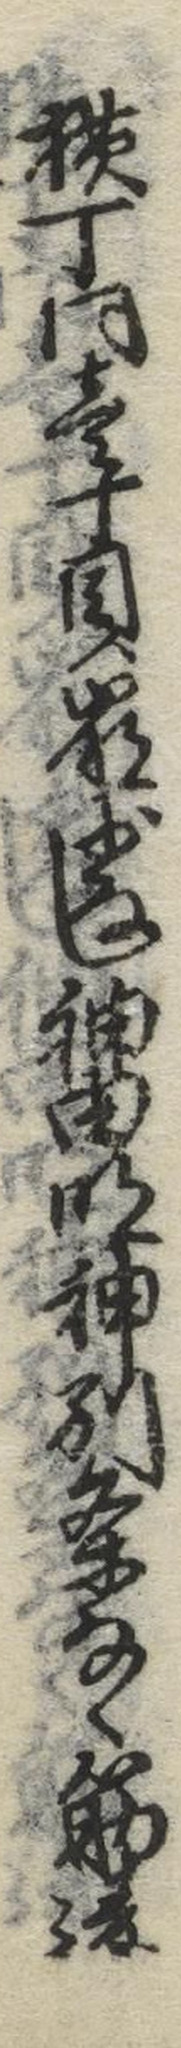横丁同壱丁目ハ崩少なし神田明神別条なく筋違
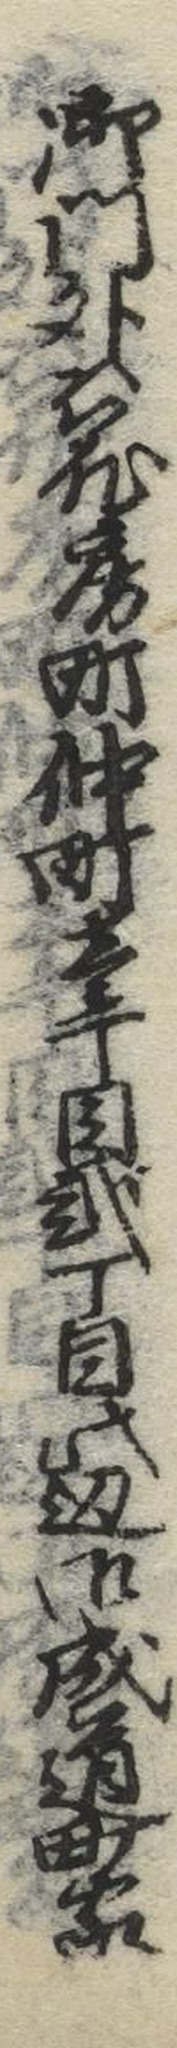御門外ハ花房町仲町壱丁目弐丁目御成道町家
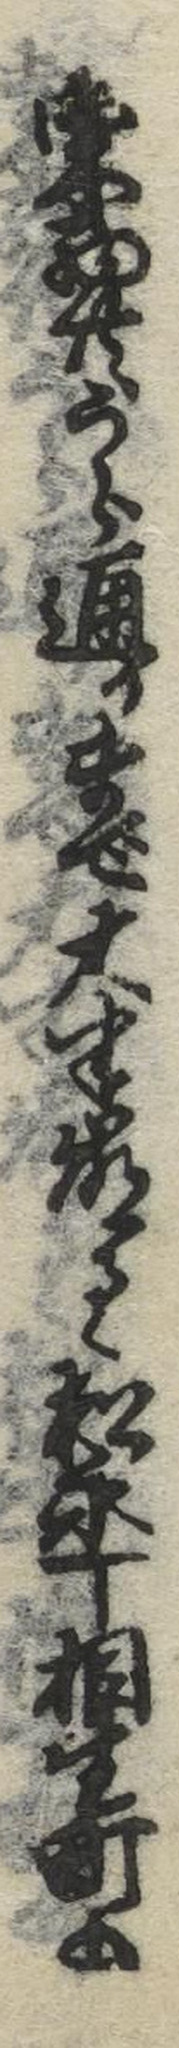東西共うら通りまで大半崩るゝ松永丁相生町も

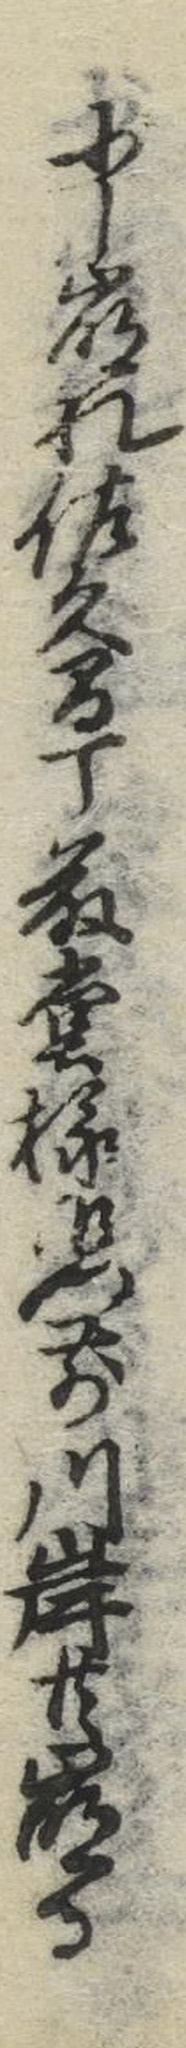少し崩れ佐久間丁藤堂様御門前川岸共崩る
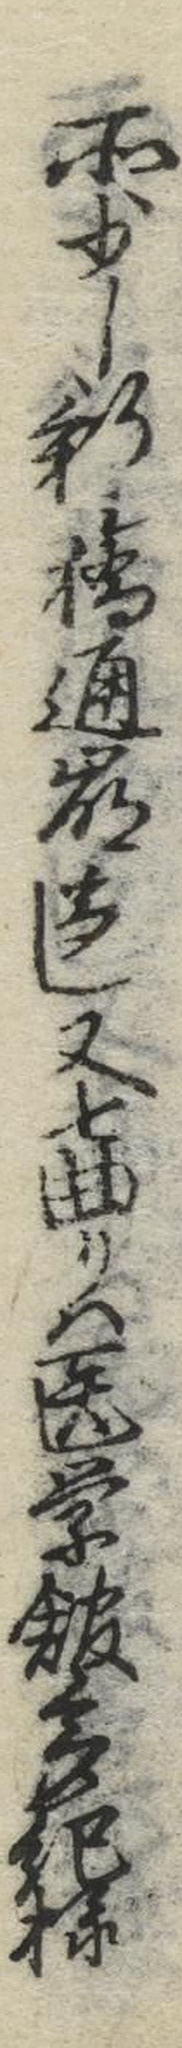所少し新橋通崩多し又七曲リハ医学館多紀様
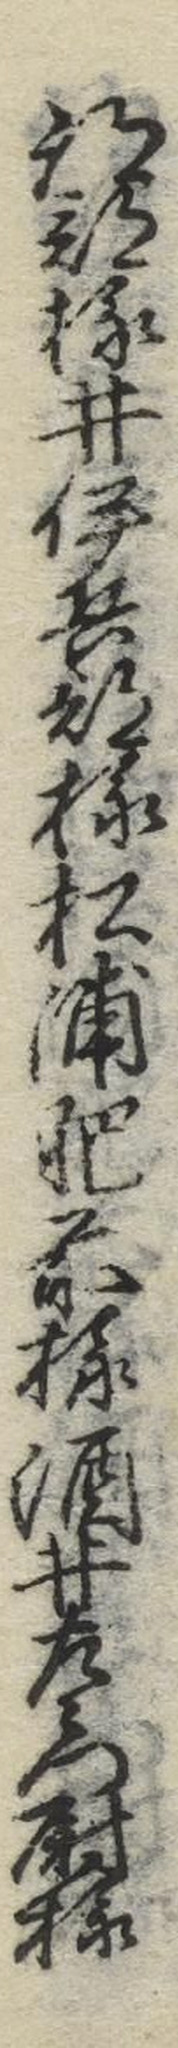跡部様井伊兵部様松浦肥前様酒井左衛門尉様
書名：江戸御屋鋪方町方共　地震類焼場所巨細書之寫　潰家潰土蔵共取調附街道筋近在迄
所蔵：東京大学地震研究所図書室 Earthquake Research Institute Library, The University of Tokyo, JAPAN
